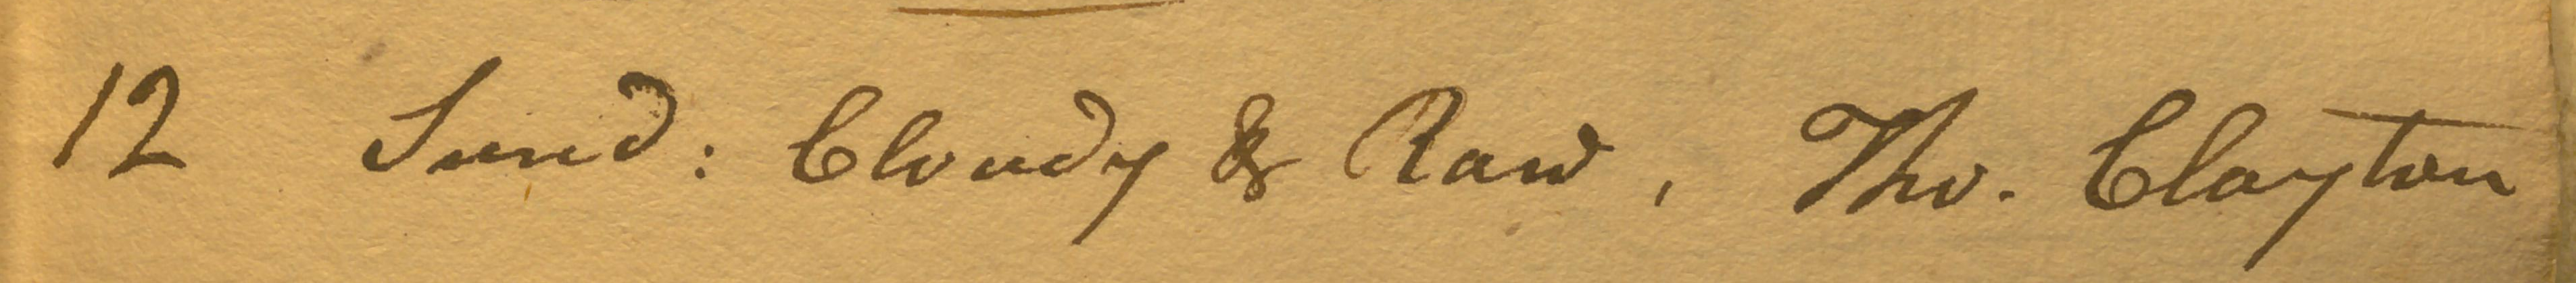12 Sund. Cloudy & Raw. Tho. Clayton
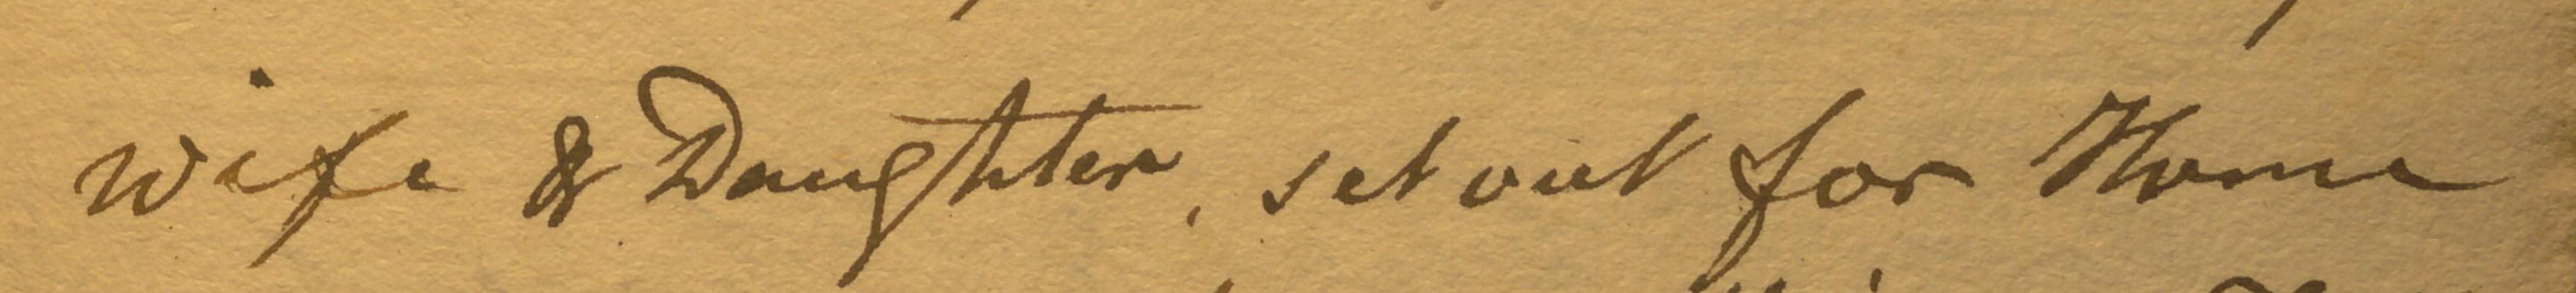wife & Daughter, set out for Home
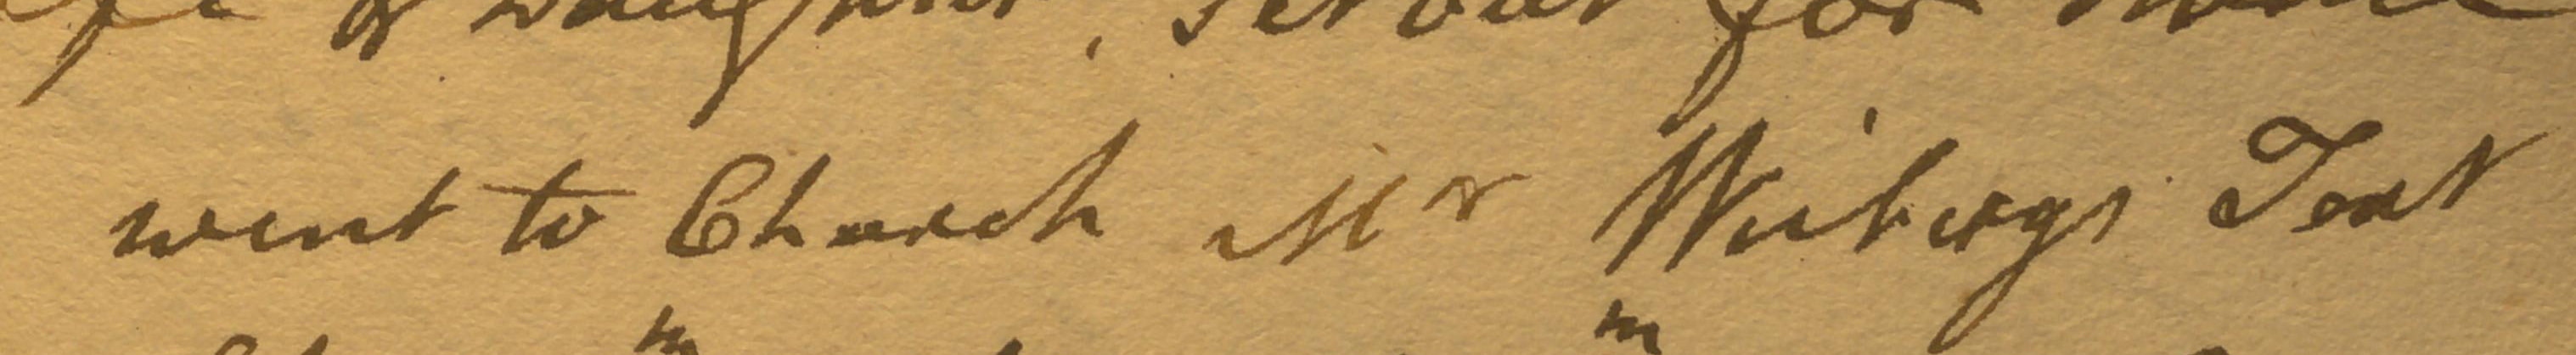went to Church M^r. Weibergs Text
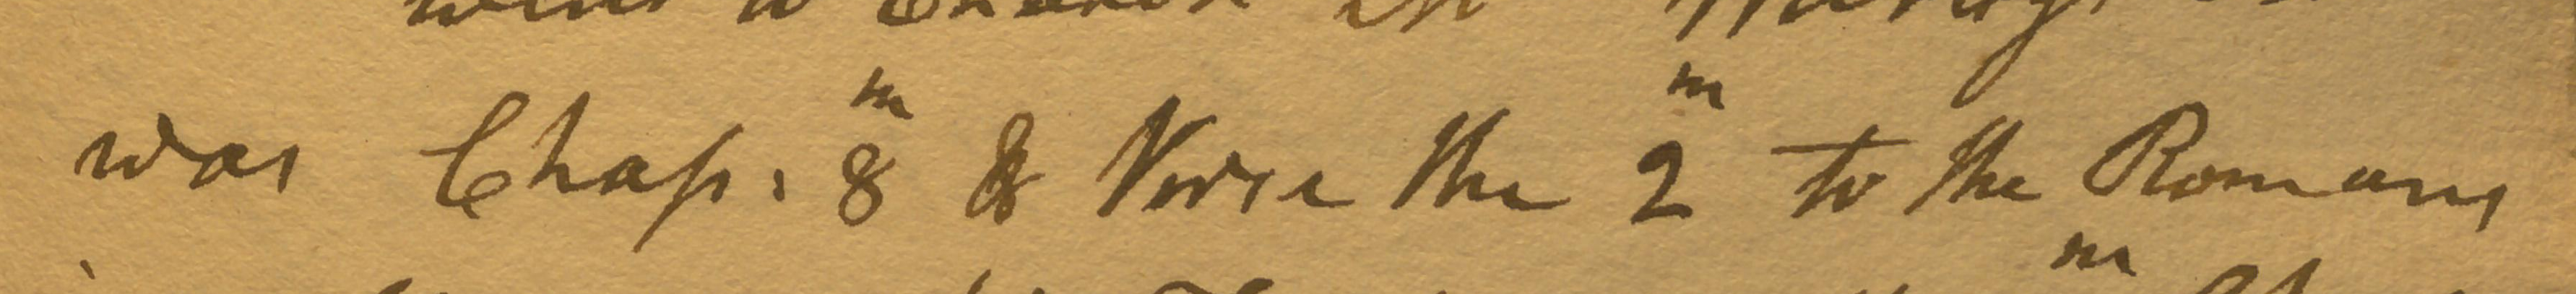was Chap. 8^th & Verse the 2^th to the Romans
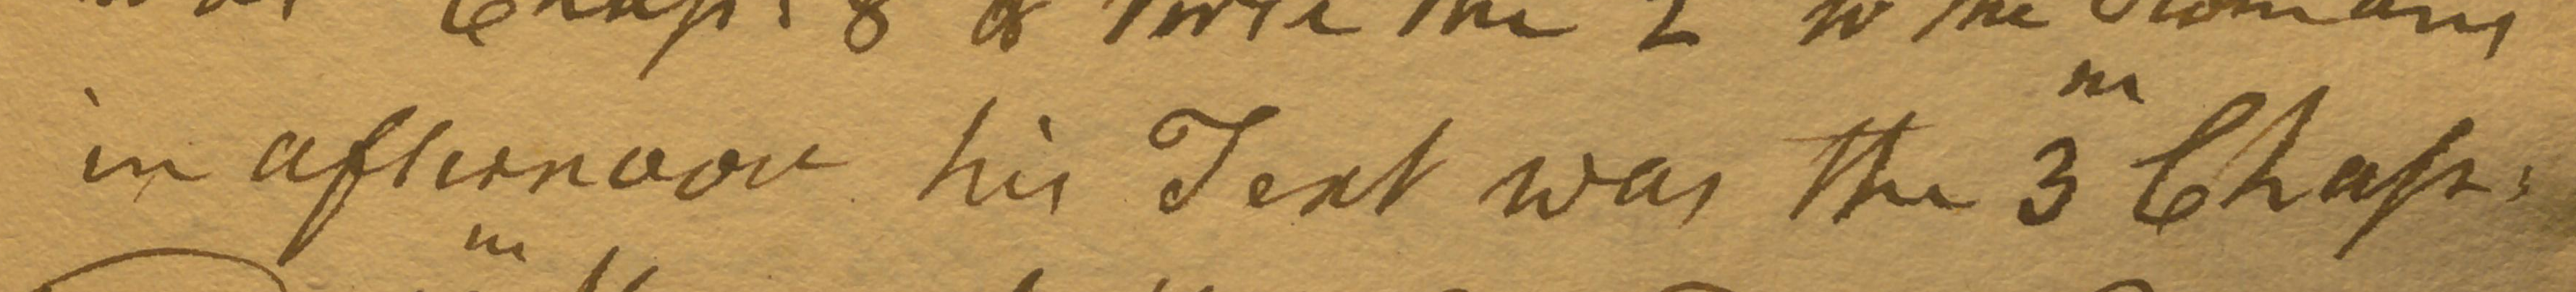in afternoon his Text was the 3^th Chap
